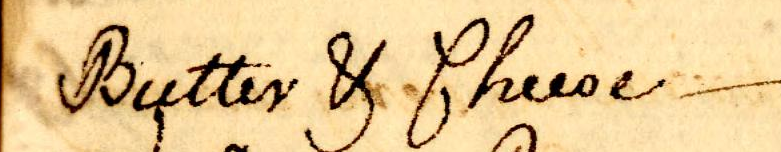Butter & Cheese-
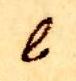l
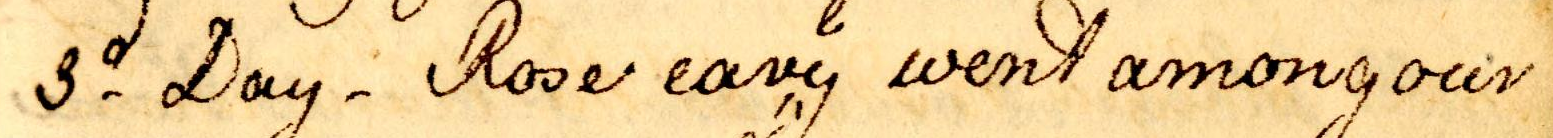3^d Day- Rose ear^y went among our
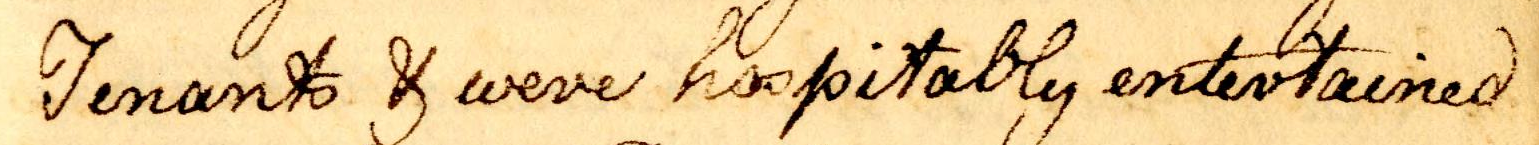Tenants & were hospitably entertained
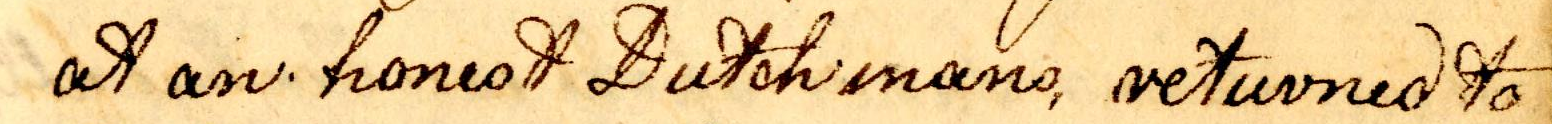at an honest Dutch mans, returned to
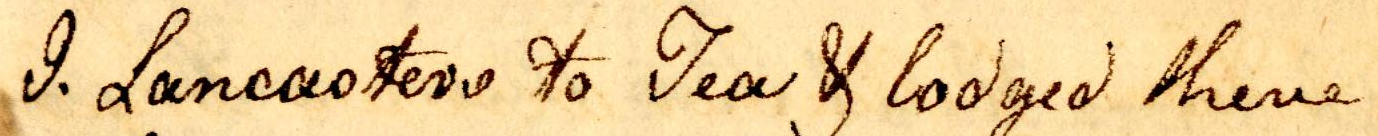I. Lancasters to Tea & lodged there
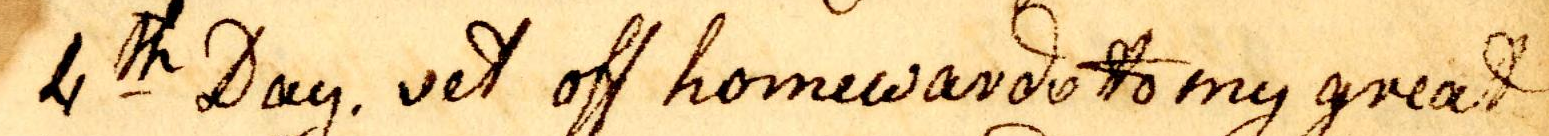4^th Day. set off homewards to my great
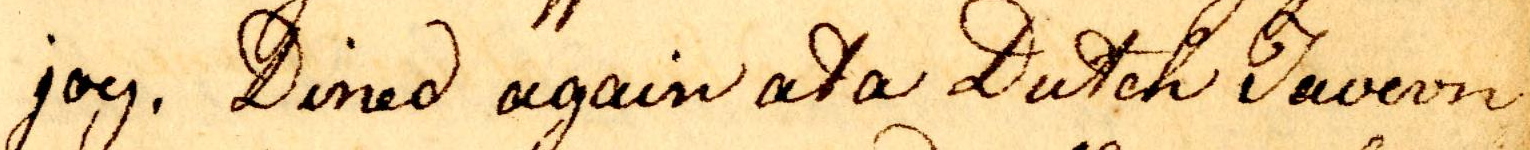joy. Dined again at a Dutch Tavern
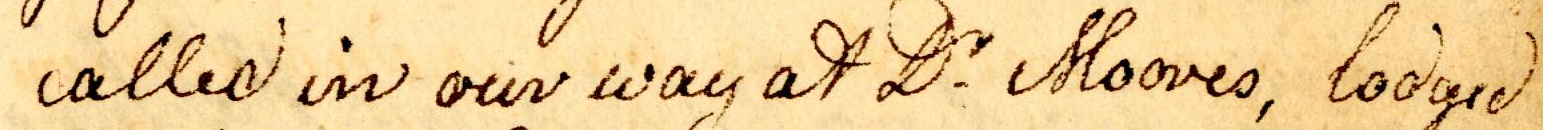called in our way at D^r. Moores, lodged
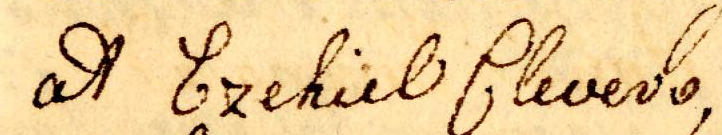at Ezekiel Clevers,
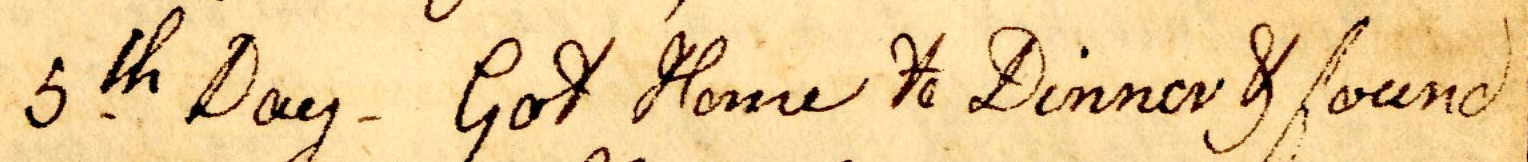5^th Day- Got Home to Dinner & found
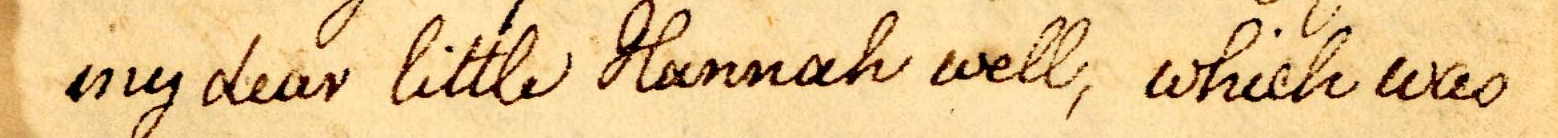my dear little Hannah well, which was
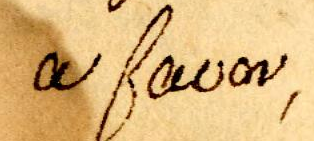a favor,
